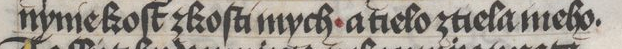nynie koſt zkoſtí mych.a tielo ztiela meho.
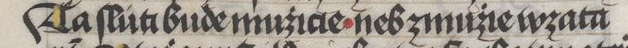Ta ſlúti bude mużicie.neb z mużie wzata
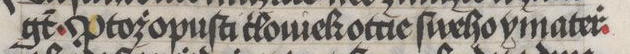ḡt. Ꝓtoż opuſti ċlouiek otcie ſweho y mateṙ.
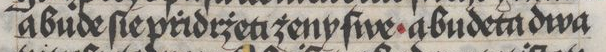a bude ſie pṙidrżeti żeny ſwe.a budeta dwa
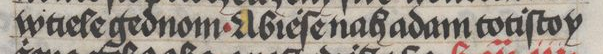w tiele gednom.A bieẛe nah adam totiẛto y
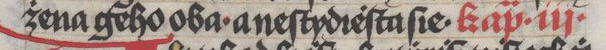żena geho oba.a neſtydieẛta ſie. kap.iii.
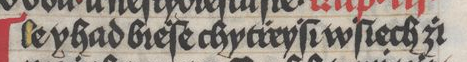le y had bieẛe chytṙeyẛi wẛiech żi¬
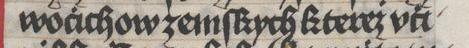woċichow zemſkych ktereż vċi¬
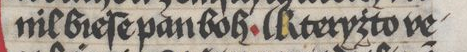nil bieẛe pan boh.Kteryżto ve¬
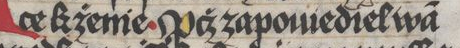ce k żenie.Ꝓcž zapouiediel wā
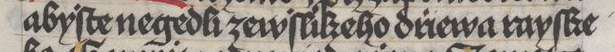abyẛte negedli zewẛlikeho dṙiewa rayſke¬
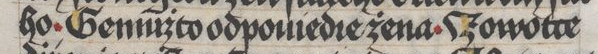ho.Gemużto odpouiedie żena.Zowotce
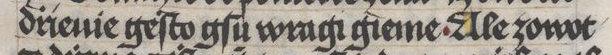dṙíeuie geẛto gſu wragi gieme.Ale zowot¬
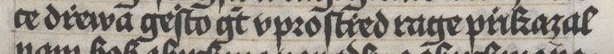ce dṙewa geẛto ḡt vproſtṙed rage pṙikazal
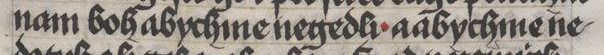nam boh abychnie negedli.a abychme ne¬
